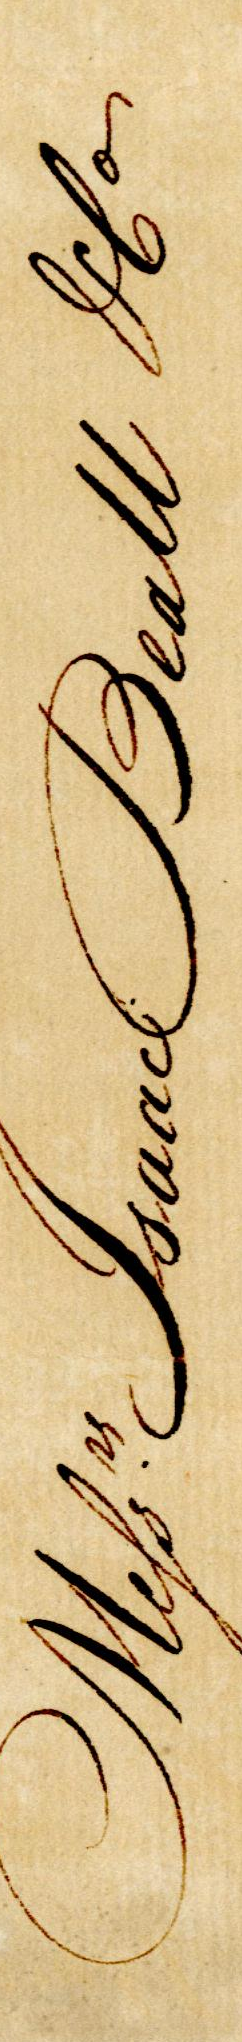Mess^r. Isaac Beall & C^o
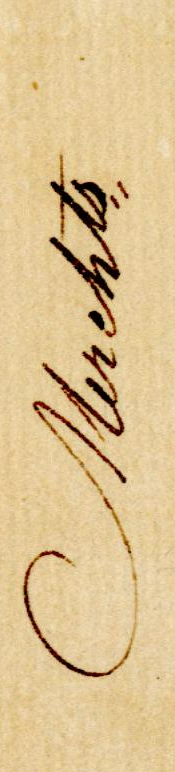Merch^ts.
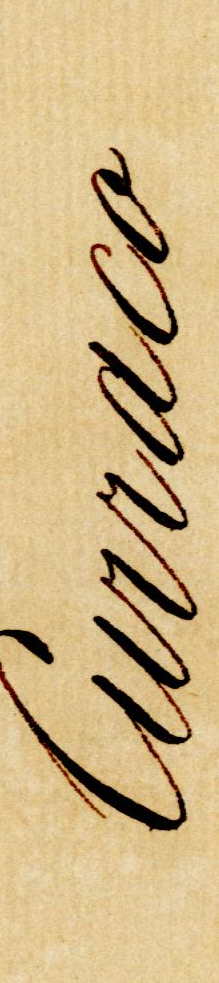Curraco
